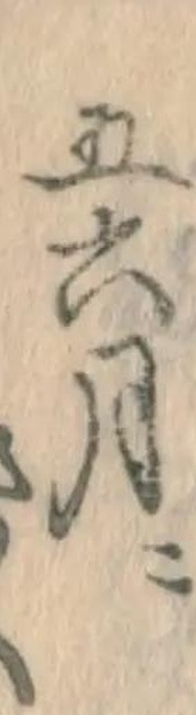五六月に
